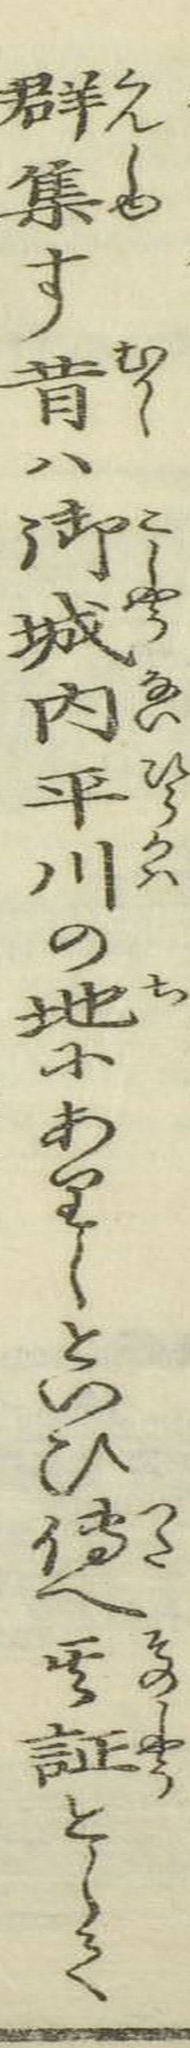群集す昔は御城内平川の地にありしといひ伝へ其証として
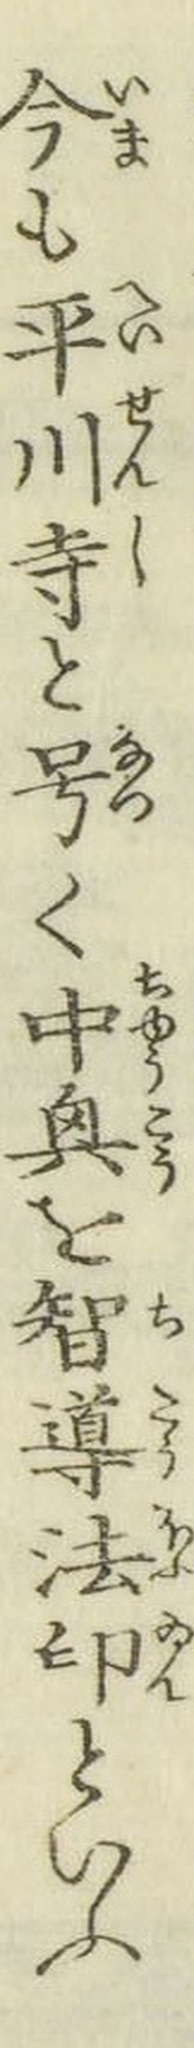今も平川寺と号く中興を智導法印といふ
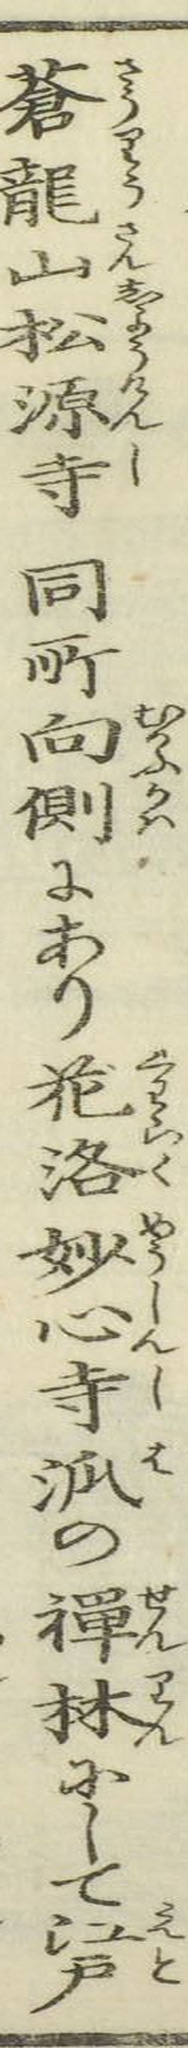蒼龍山松源寺同所向側にあり花洛妙心寺派の禅林にして江戸
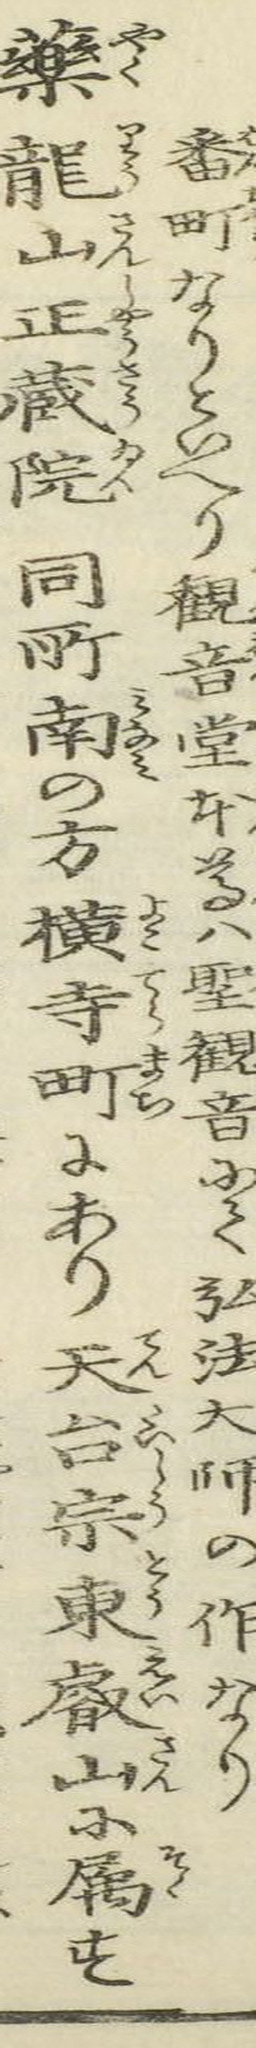薬竜山正蔵院同所南の方横寺町にあり天台宗東叡山に属す
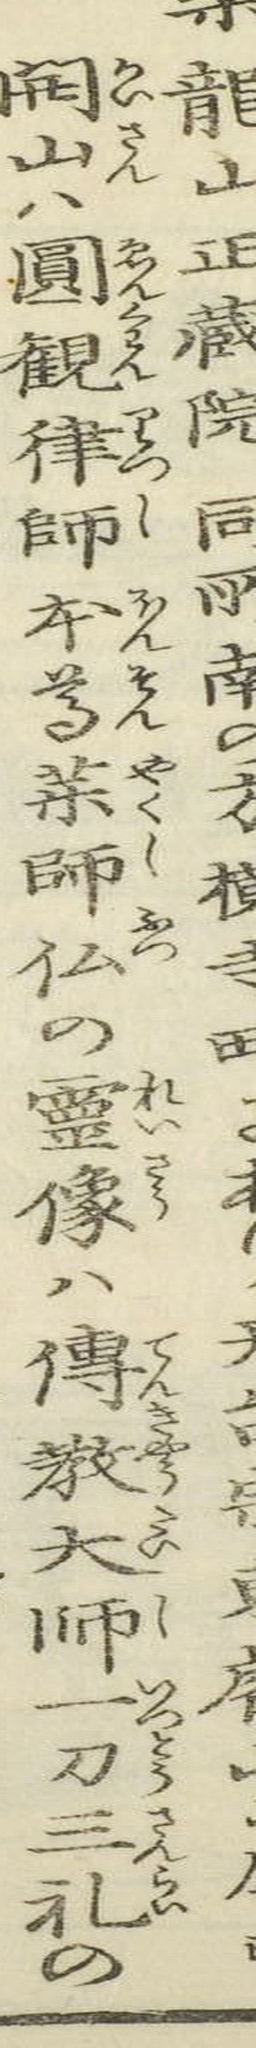開山は円観律師本尊薬師仏の霊像は伝教大師一刀三礼の
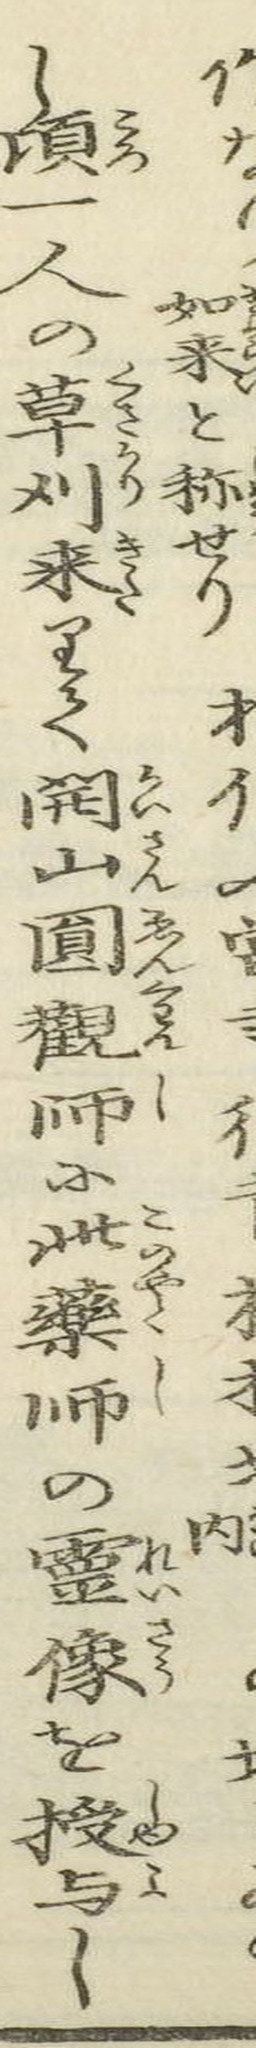し頃一人の草刈来りて開山円観師に此薬師の霊像を授与し
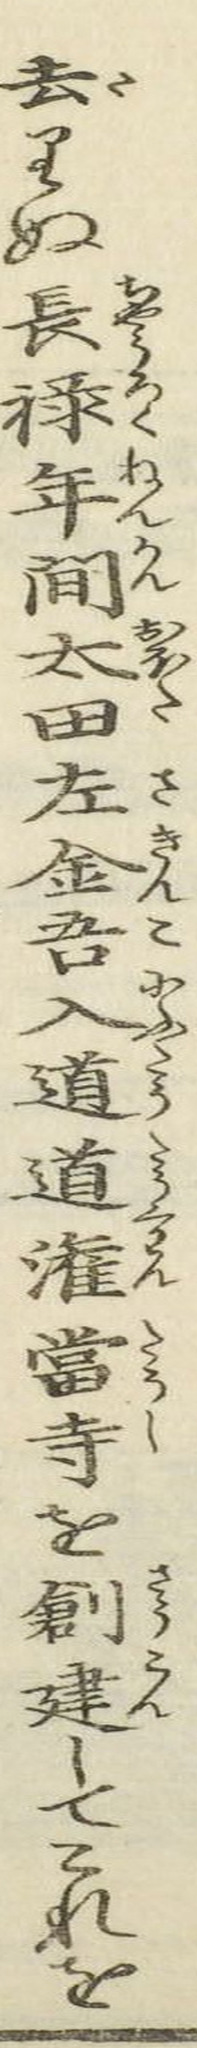去りぬ長禄年間太田左金吾入道道灌当寺を創建してこれを
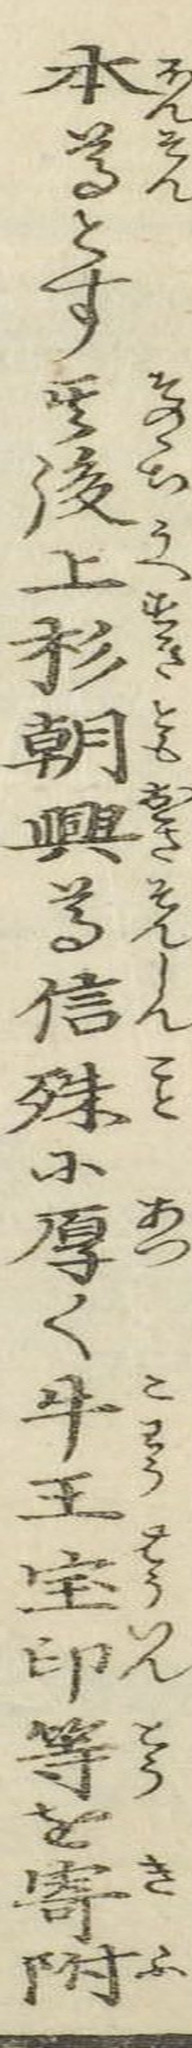本尊とす其後上杉朝興尊信殊に厚く牛王宝印等を寄附
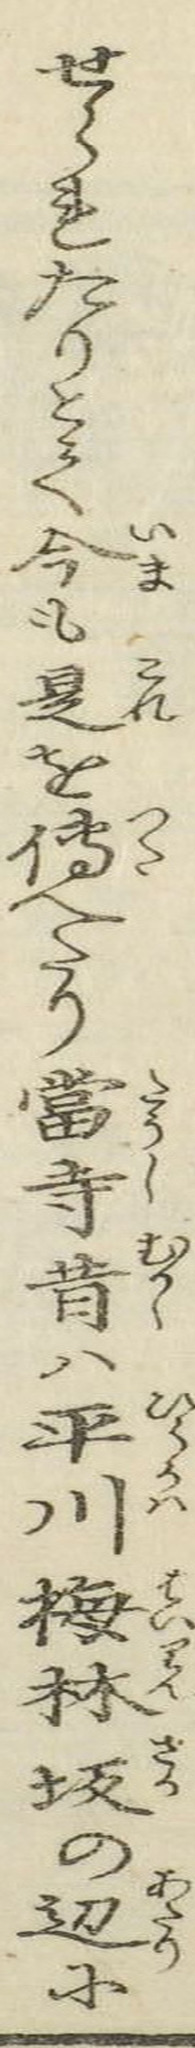せられたりとて今も是を伝へたり当寺昔は平川梅林坂の辺に
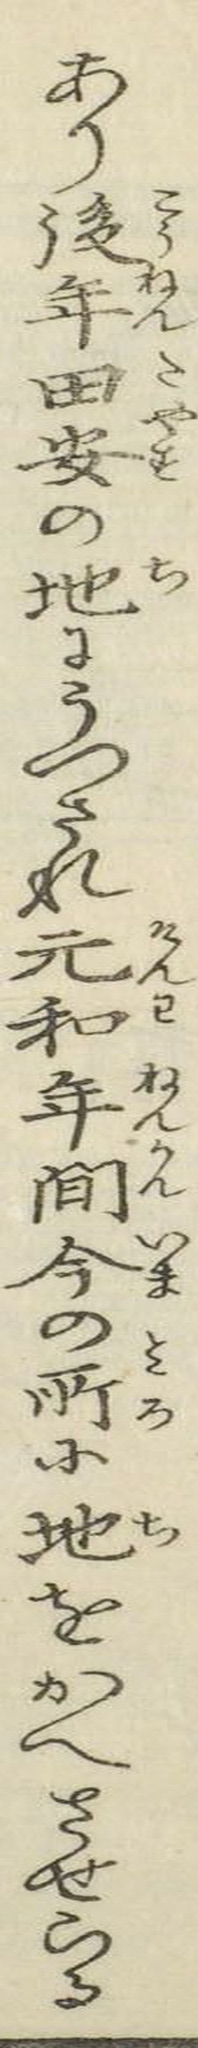あり後年田安の地にうつされ元和年間今の所に地をかへさせらる
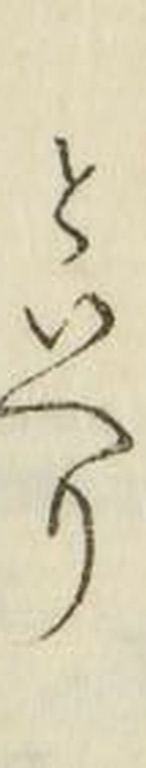といへり
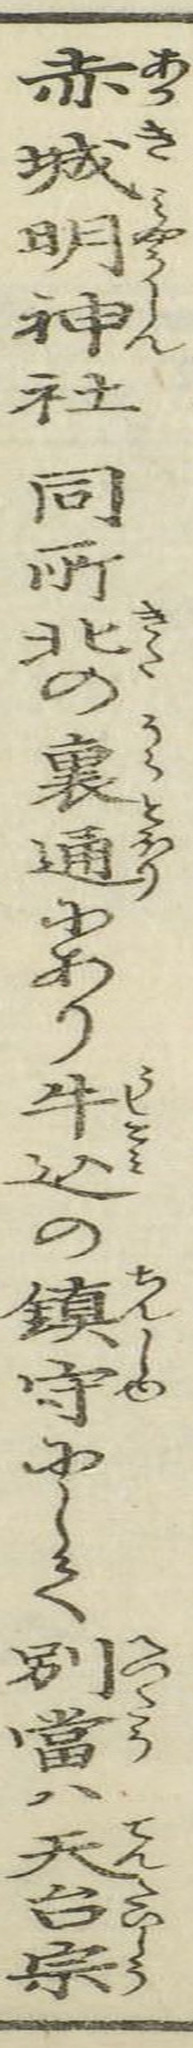赤城明神社同所北の裏通にあり牛込の鎮守にして別当は天台宗
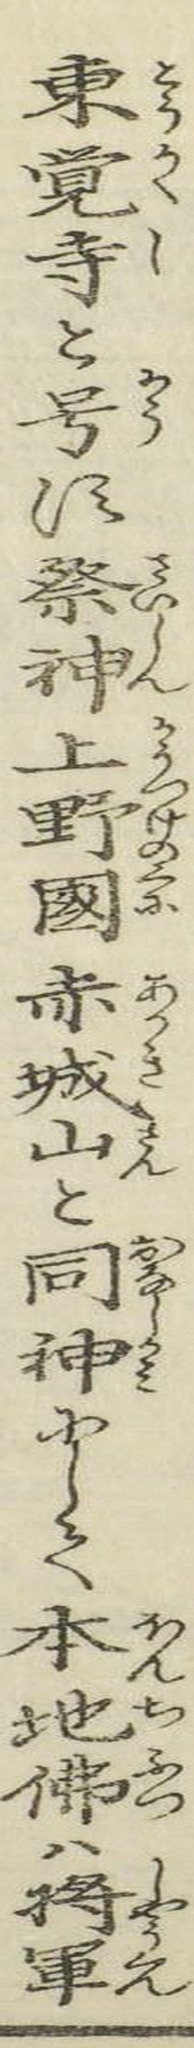東覚寺と号す祭神上野国赤城山と同神にして本地仏は将軍
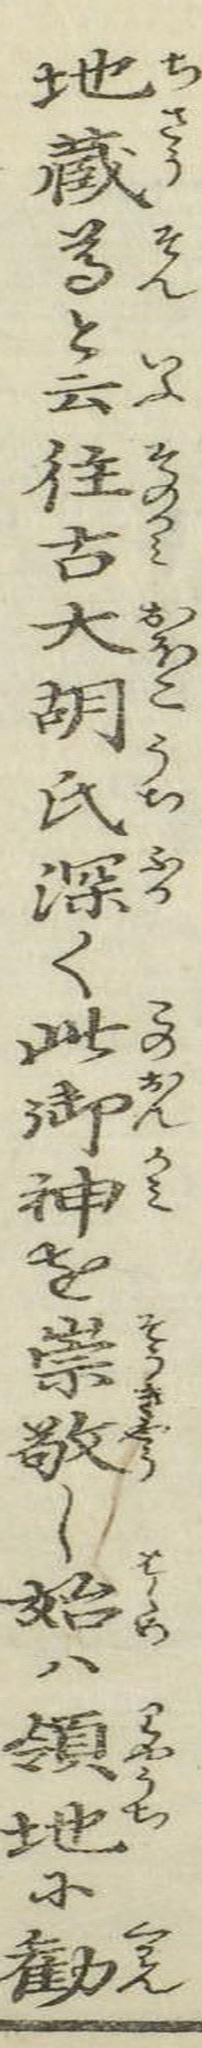地蔵尊と云往古大胡氏深く此御神を崇敬し始は領地に勧
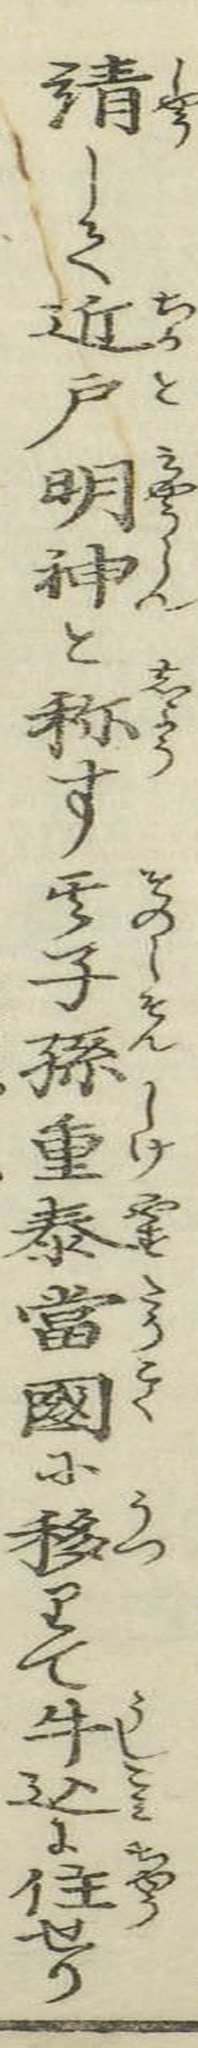請して近戸明神と称す其子孫重泰当国に移りて牛込に住せり
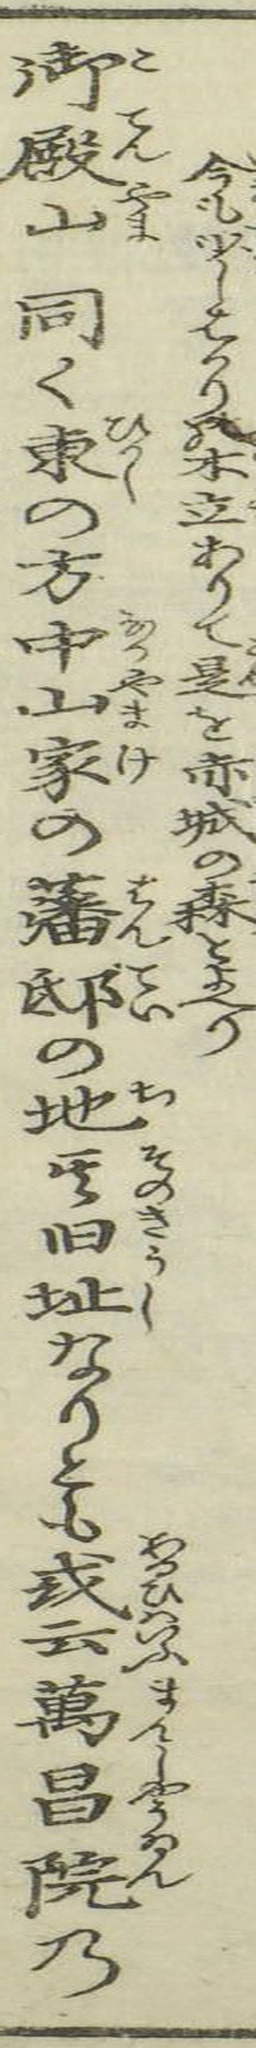御殿山同く東の方中山家の藩邸の地其旧址なりとも或云万昌院の
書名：江戸名所図会 20巻 巻之11
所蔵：東京学芸大学教育コンテンツアーカイブ
